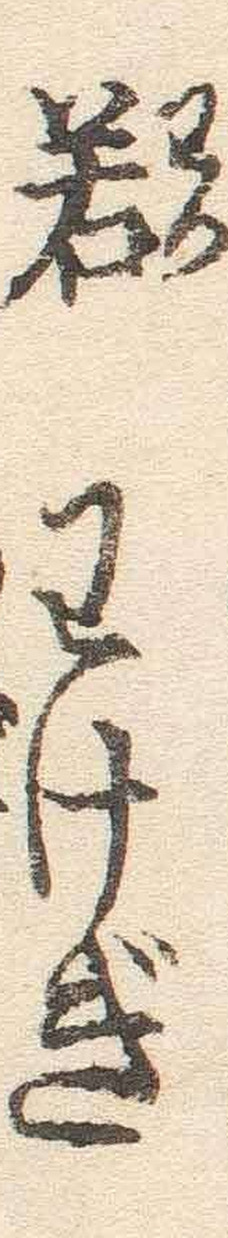若わけぎ
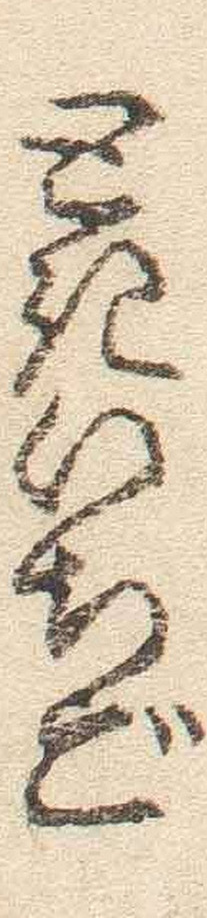ときいちご

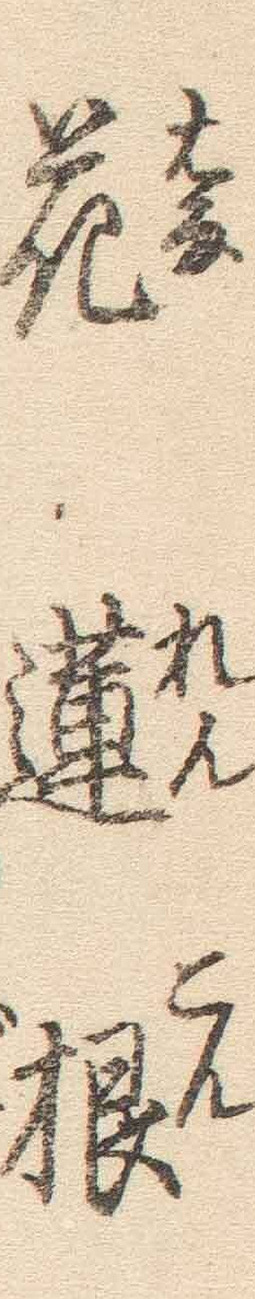花蓮根
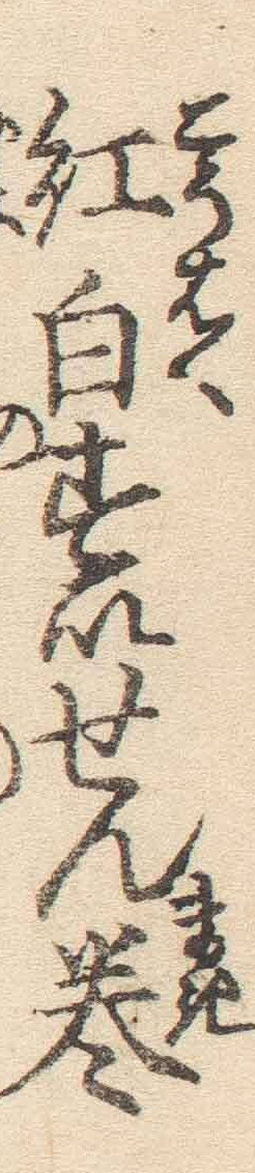紅白すいせん巻
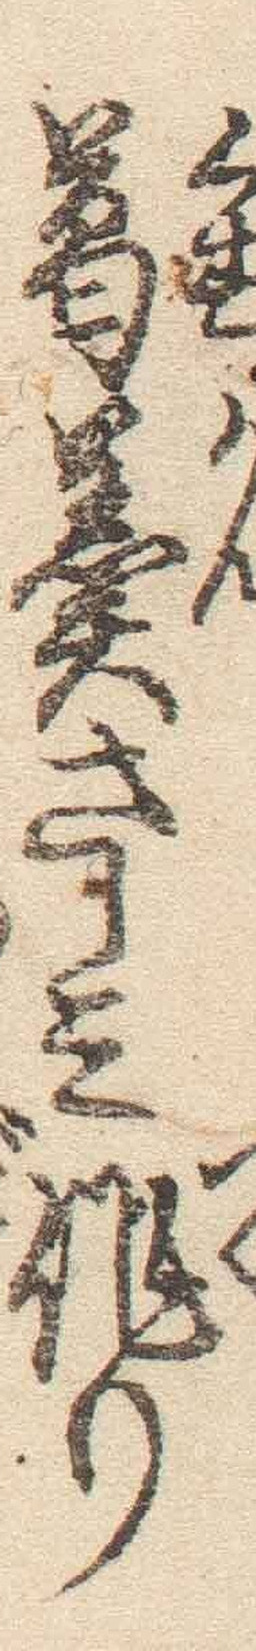葛羹さしみ作り
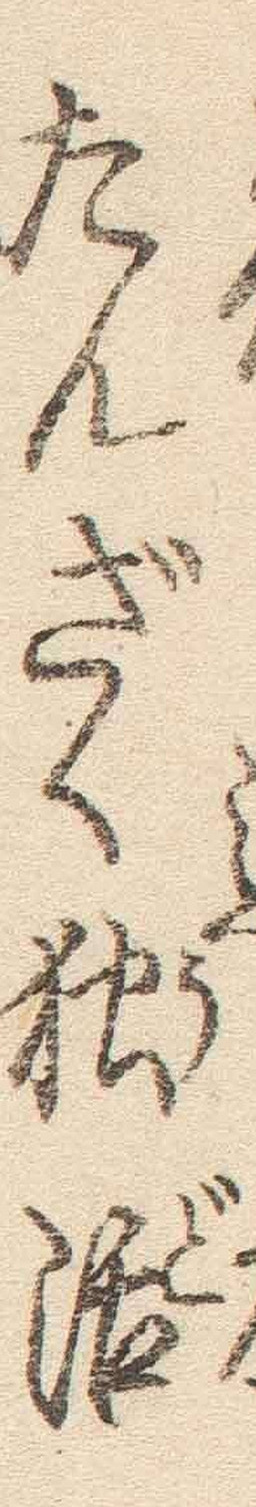たんざく独活
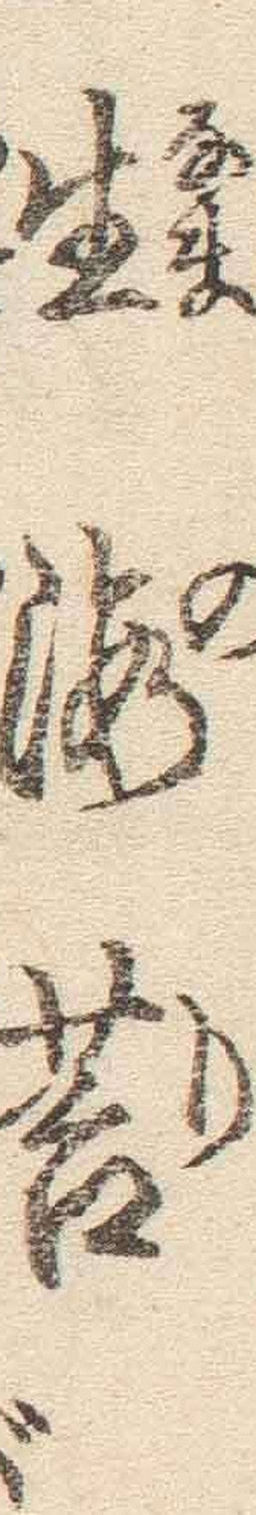生海苔
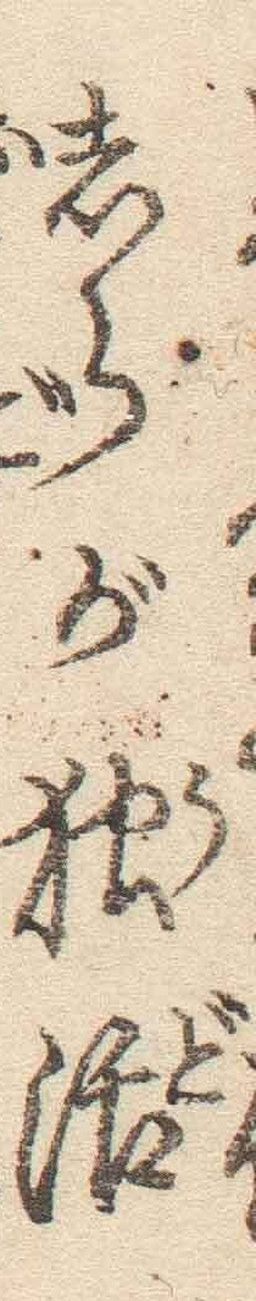しらが独活
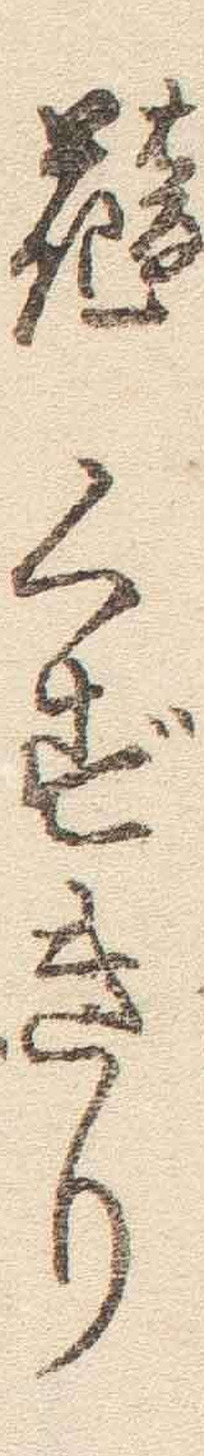花くずきり
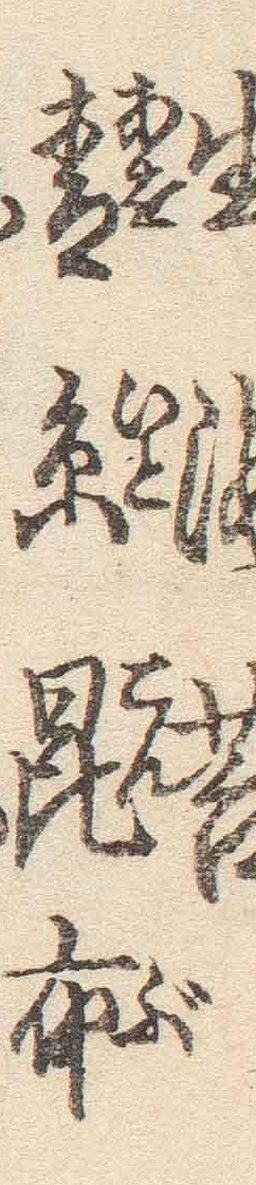青糸昆布
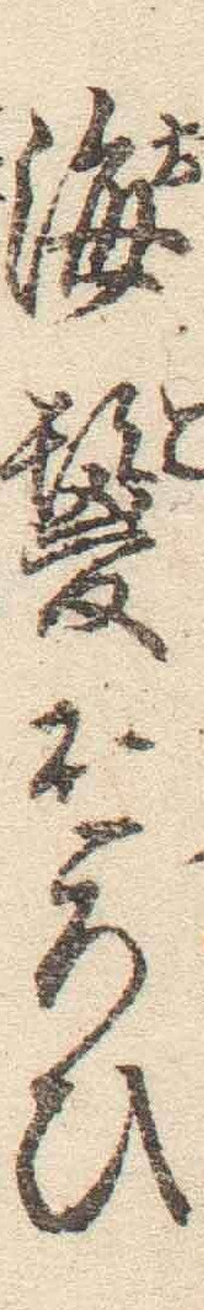海髪そろひ
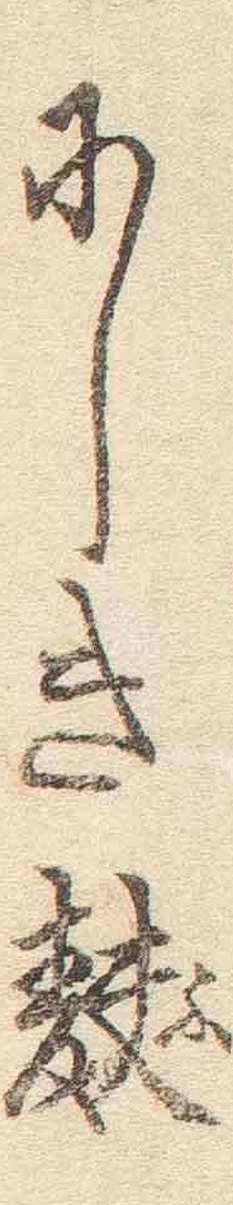にしき麩
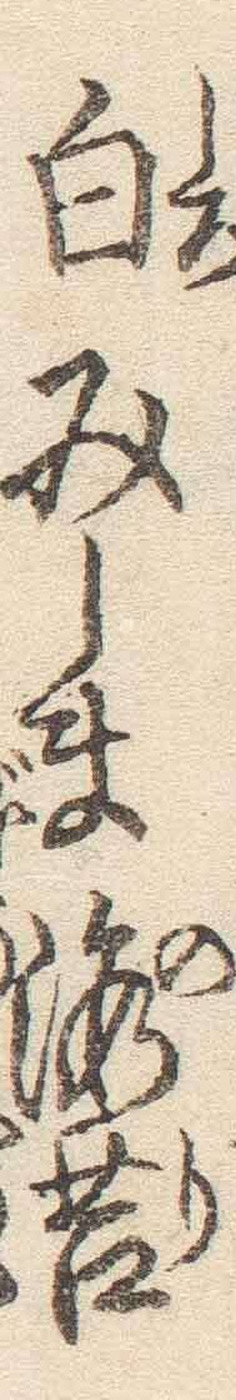白みしま海苔
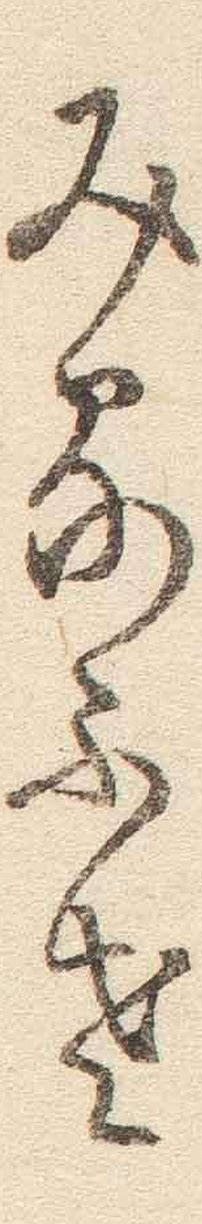みなふさ
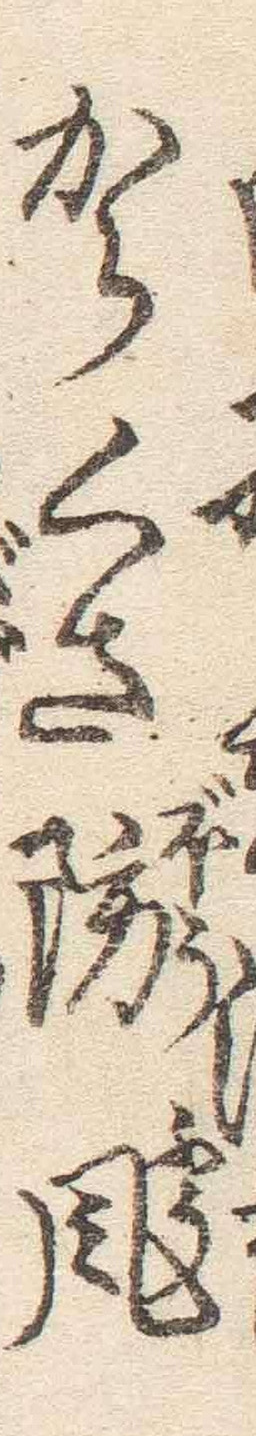からくさ防風
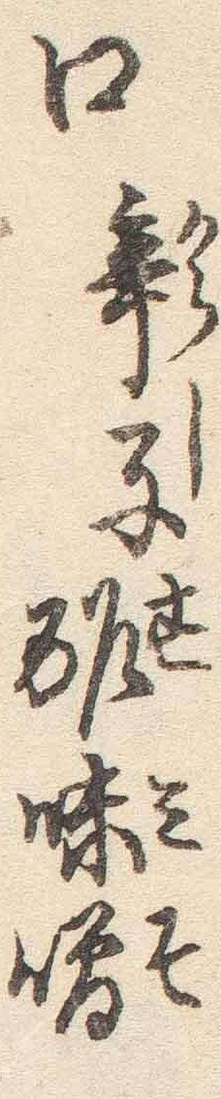猪口辛子酢味噌
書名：料理通
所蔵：東京学芸大学附属図書館 国文学研究資料館
